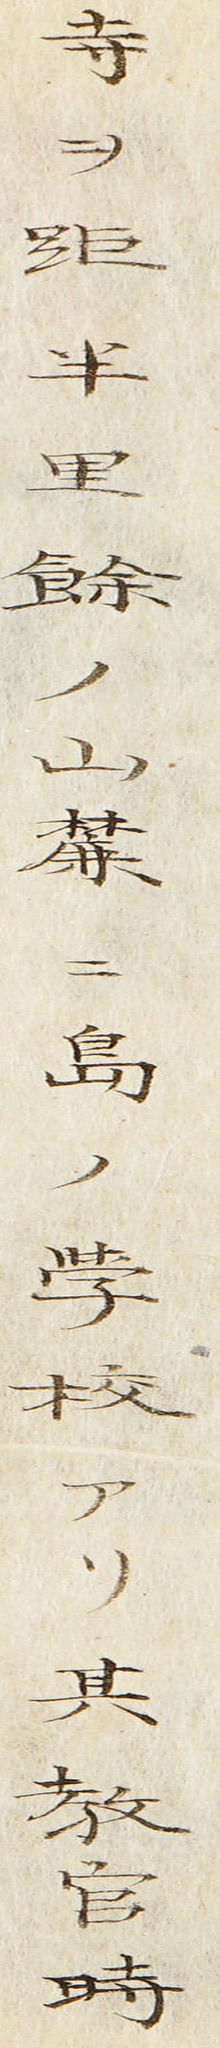寺ヲ距半里余ノ山麓ニ島ノ学校アリ其教官時
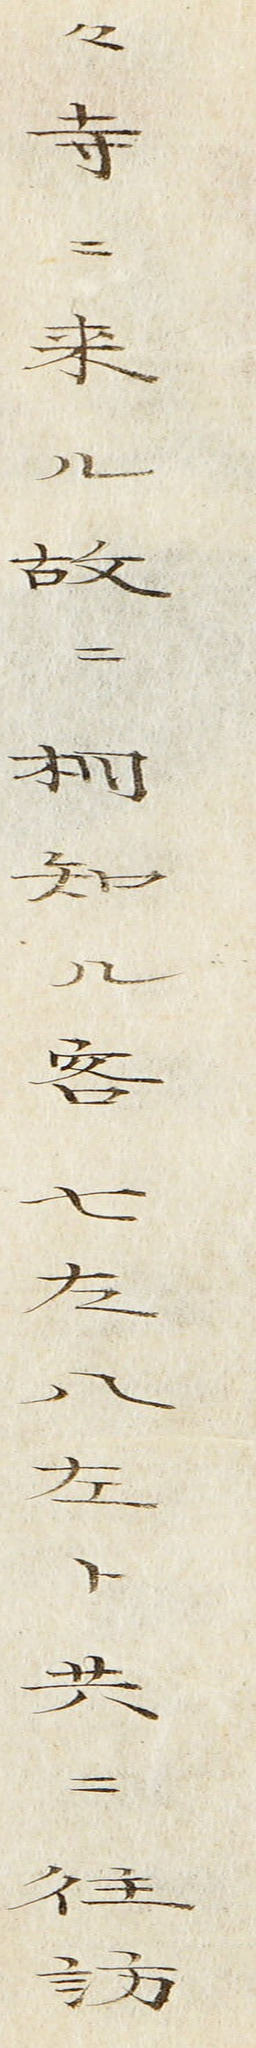々寺ニ来ル故ニ相知ル客七左八左ト共ニ往訪
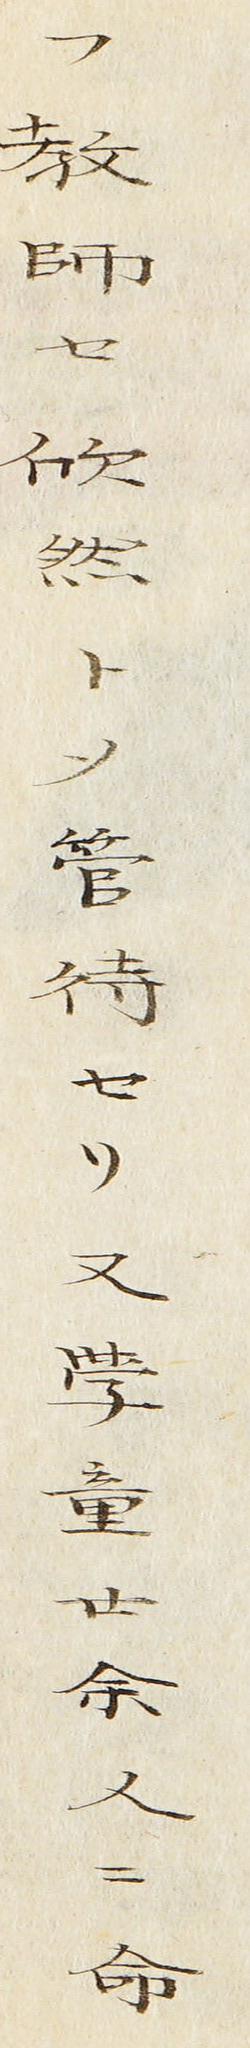フ教師セ欣然トシテ管待セリ又学童廿余人ニ命
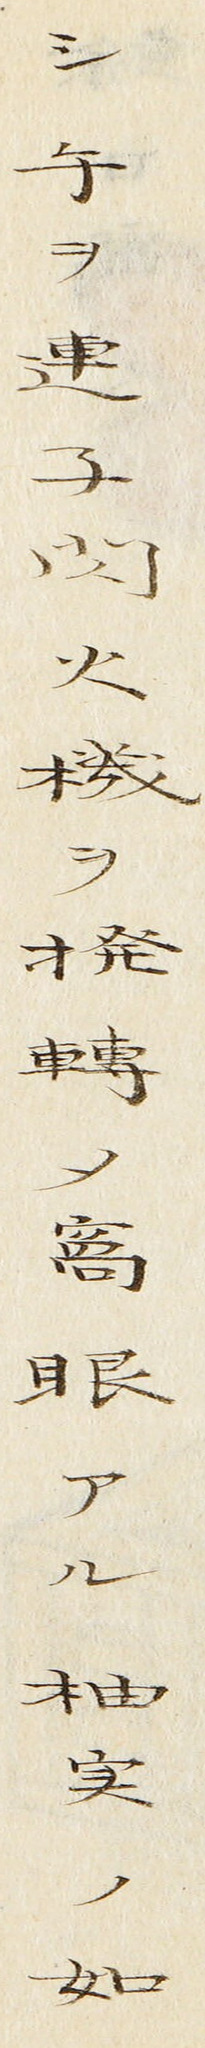シ手ヲ連ネ閃火機ヲ撥転シテ窩眼アル柚子実ノ如
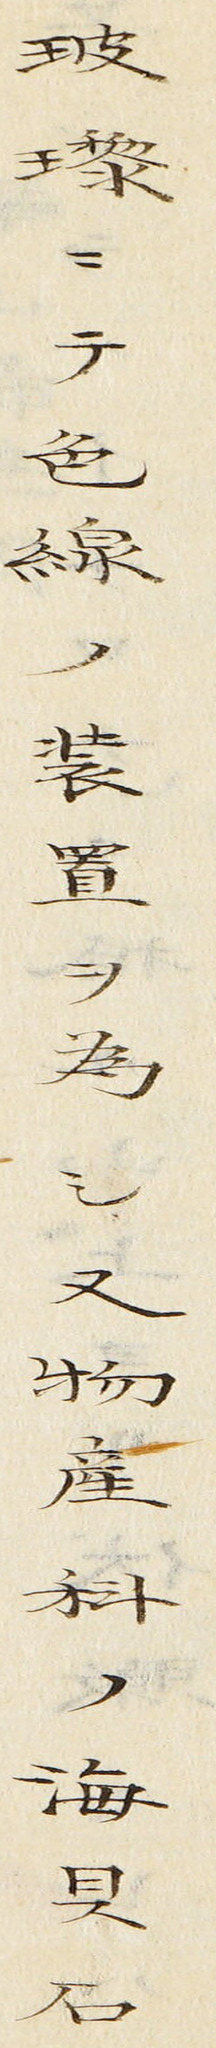玻瓈ニテ色線ノ装置ヲ為シ又物産科ノ海貝石
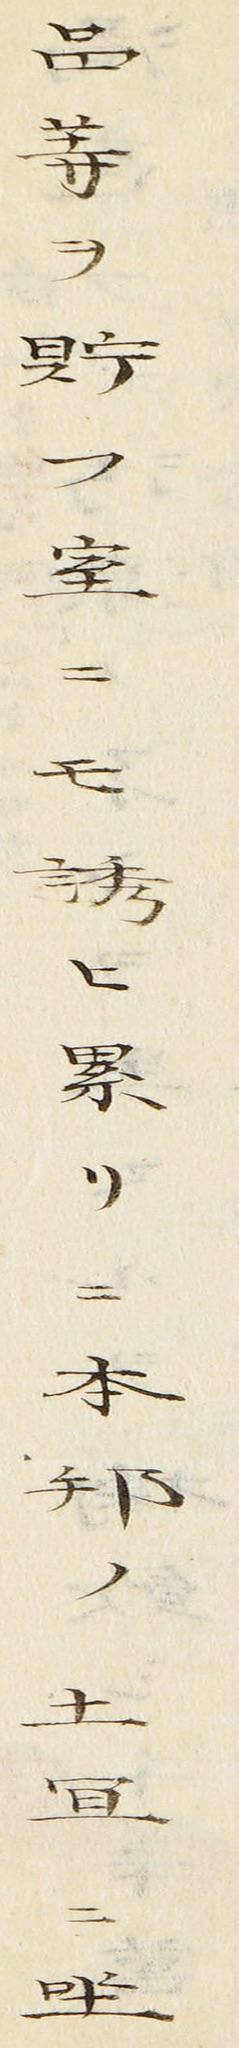品等ヲ貯フ室ニモ誘ヒ累リニ本邦ノ土宜ニ坐
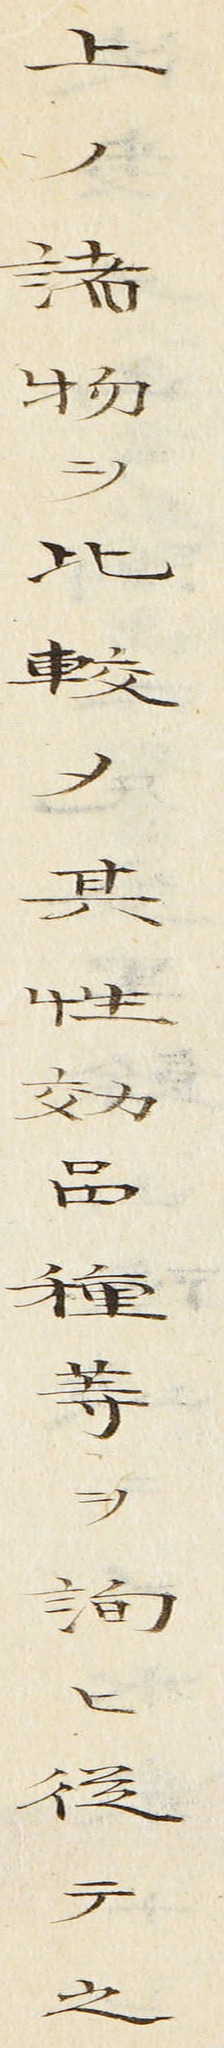上ノ諸物ヲ比較シテ其性効品種等ヲ詢ヒ従テ之
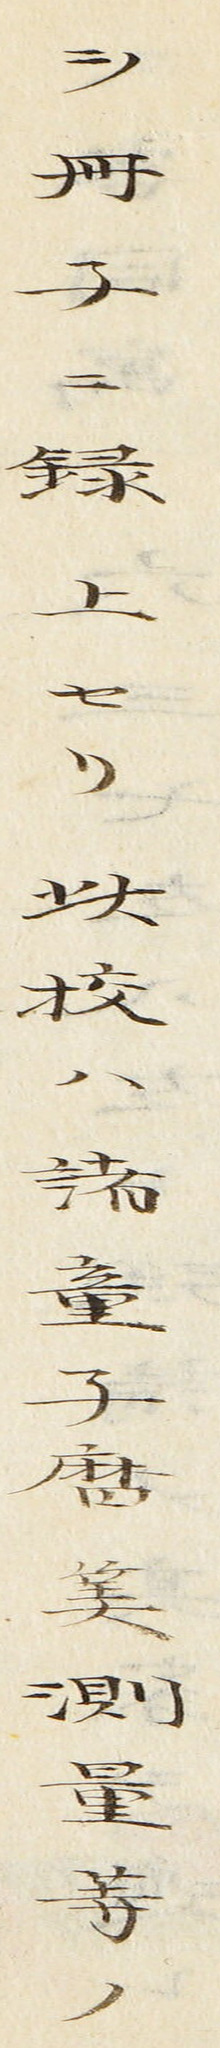ヲ冊子ニ録上セリ此校ハ諸童子暦算測量等ノ
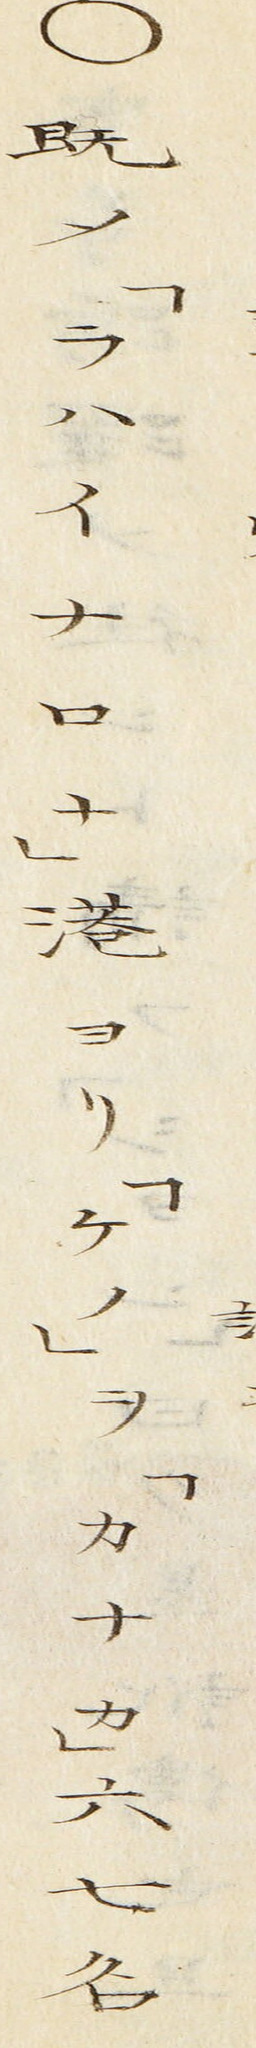○既シテ「ラハイナロナ」港ヨリ「ケノ」ヲ「カナカ」六七名
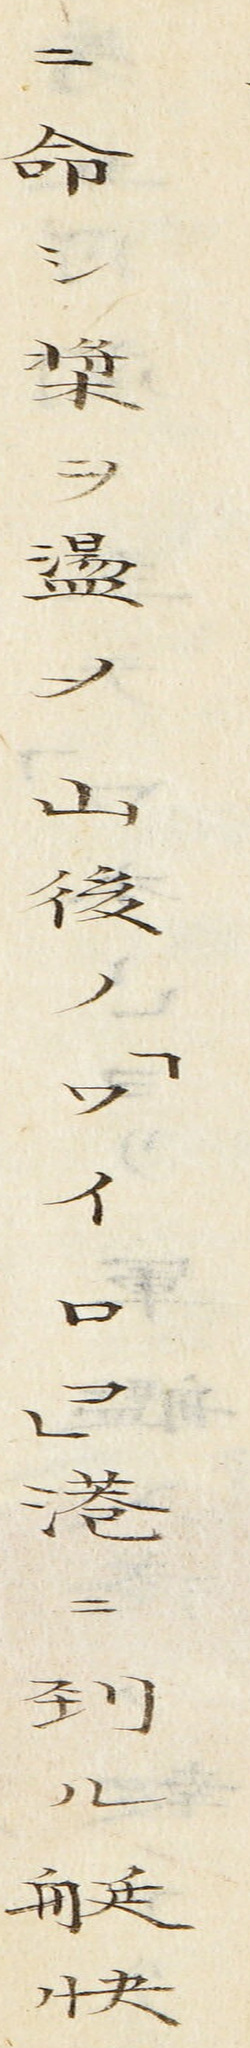ニ命シ槳ヲ盪シテ山後ノ「ワイロコ」港ニ到ル艇快
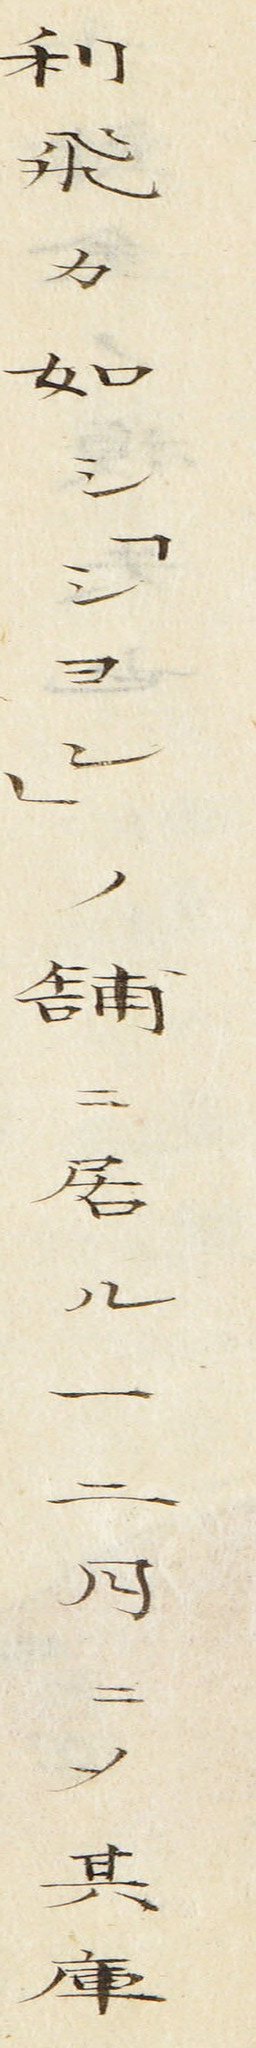利飛カ如シ「シヨン」ノ舗ニ居ル一二月ニシテ其庫
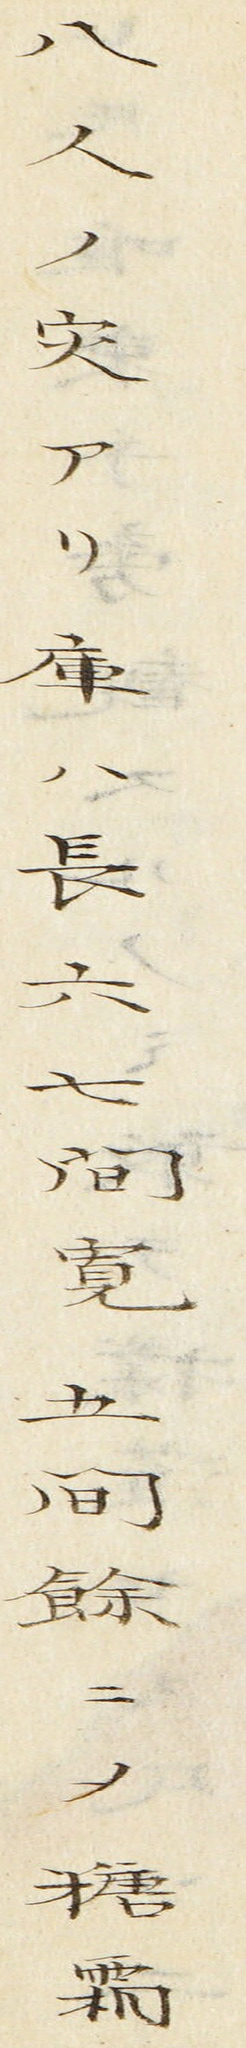八人ノ災アリ庫ハ長六七間寛五間余ニシテ糖霜
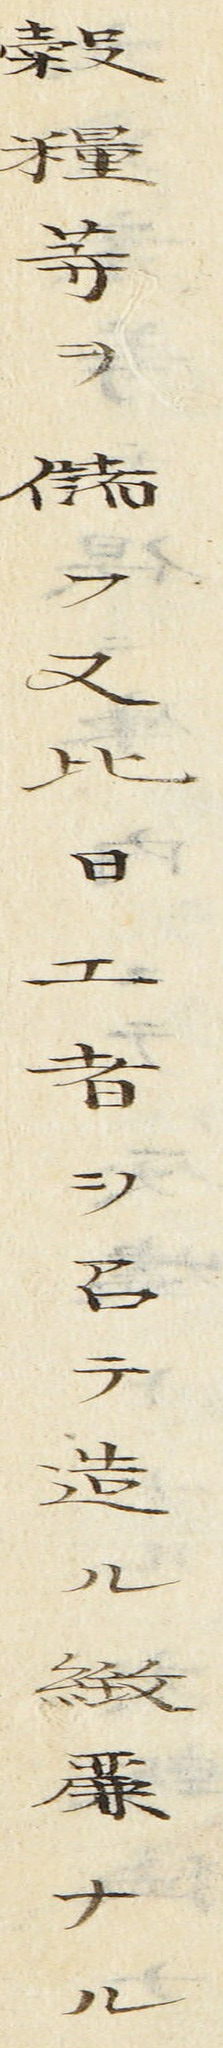穀糧等ヲ儲フ又比日工者ヲ召テ造ル緻麗ナル

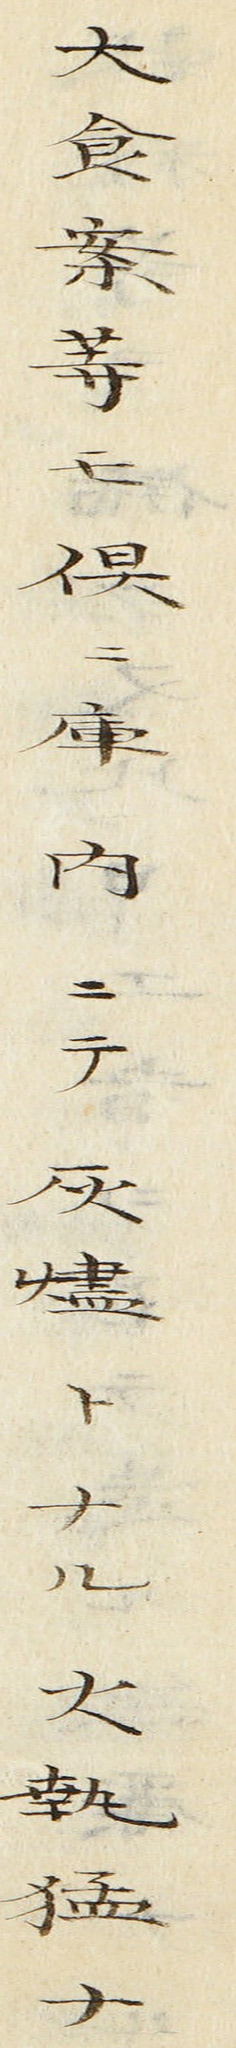大食案等モ倶ニ庫内ニテ灰燼トナル火執猛ナ
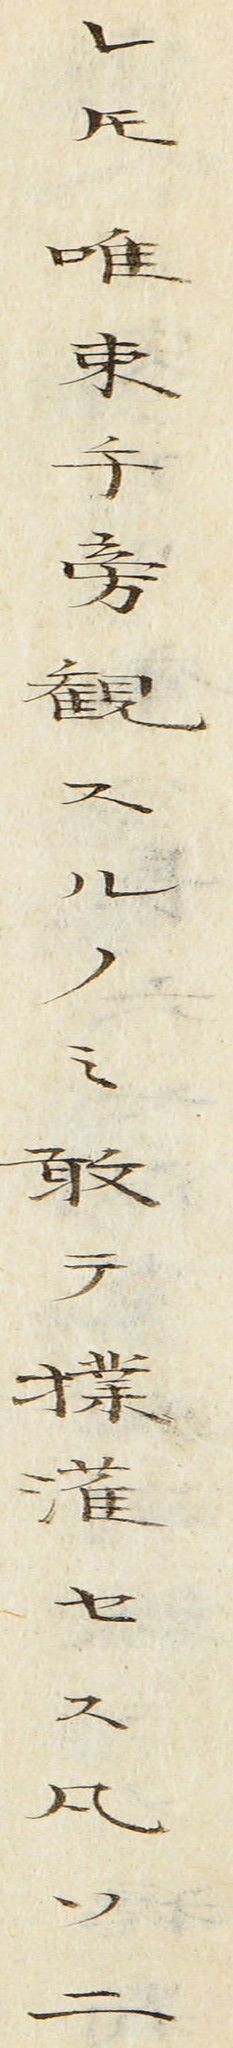レトモ唯束手旁観スルノミ敢テ撲灌セス凡ソ二
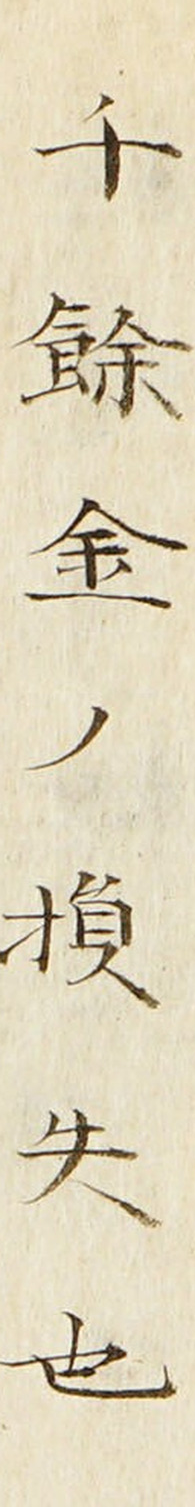千余金ノ損失也
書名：蕃談
